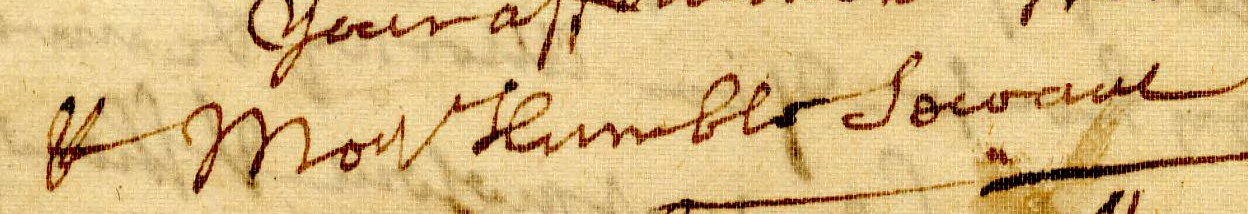& Most Humble Servant
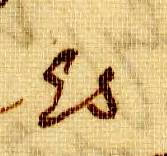ES
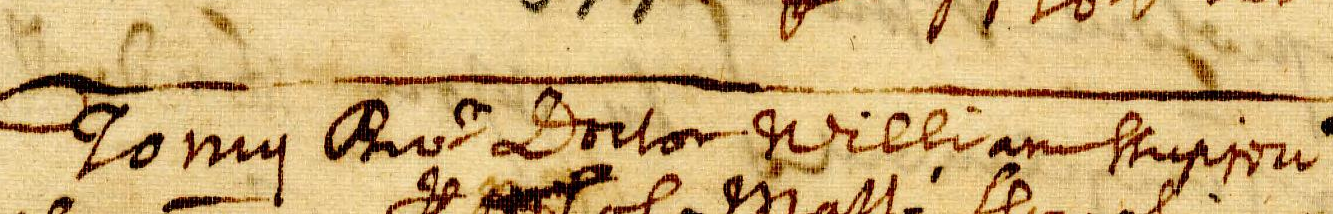To my Bro^r. Doctor William Shippen
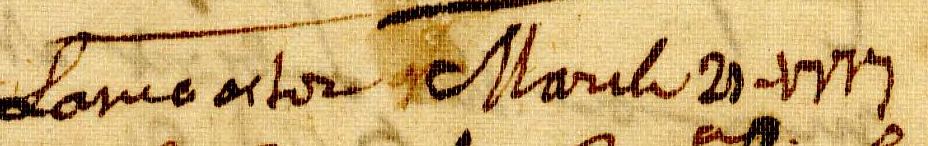Lancaster March 21-1777
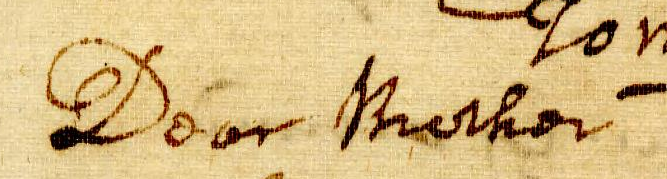Dear Brother
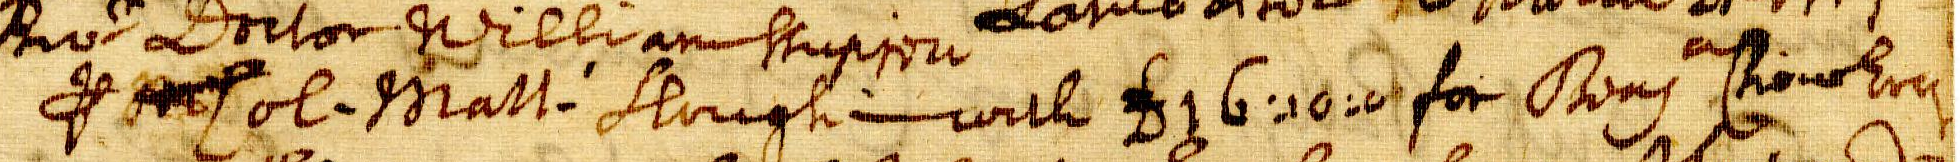per [M] Col-Matt-' Hough -with £26..10..0 for Benj^a Chew Esq
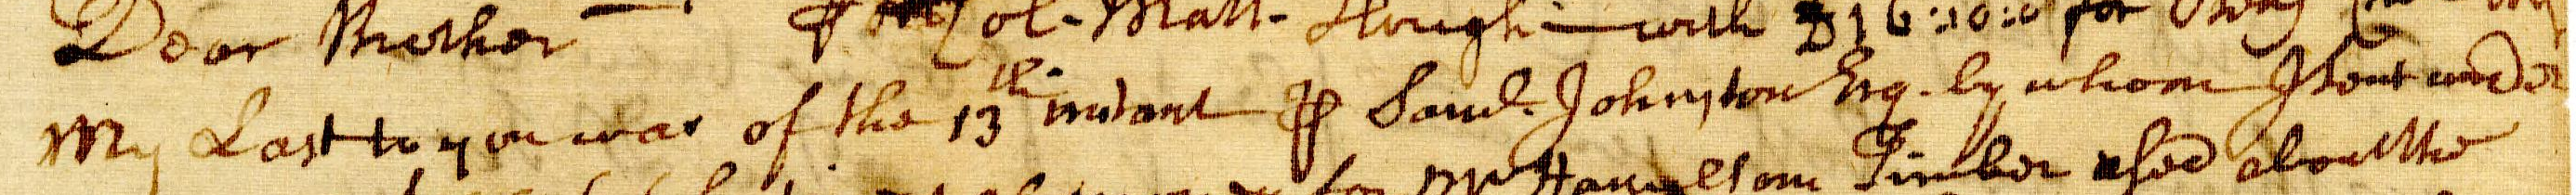My Last to you was of the 13^th instant per Saml. Johnston Esq. by whom I sent under
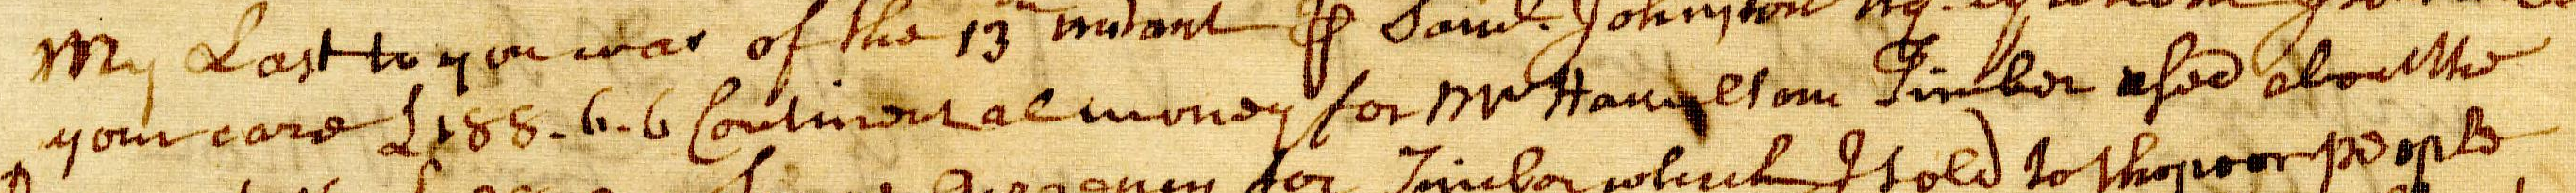your care £188.6.6 Continental Money for M^r Hamiltons Timber used about the
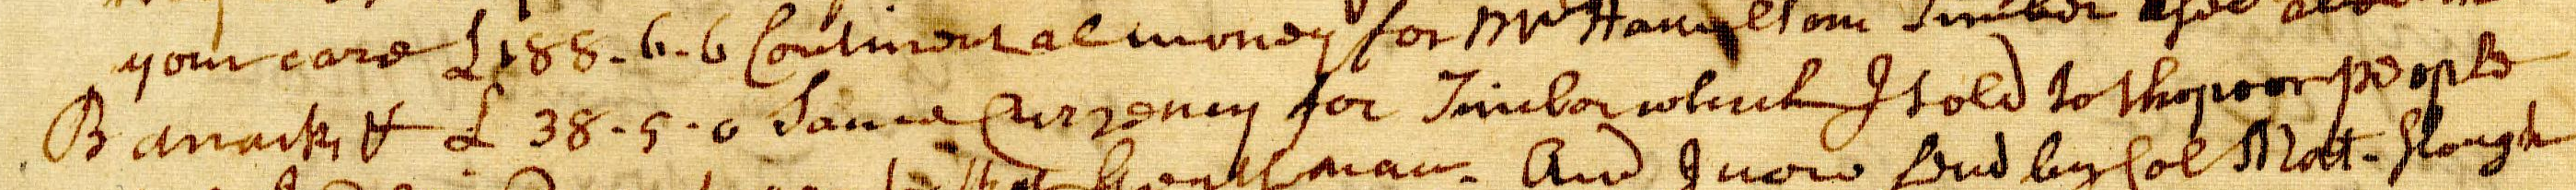Barracks & £38.5. 8 Same Currency for Timber which I sold to the poor people
